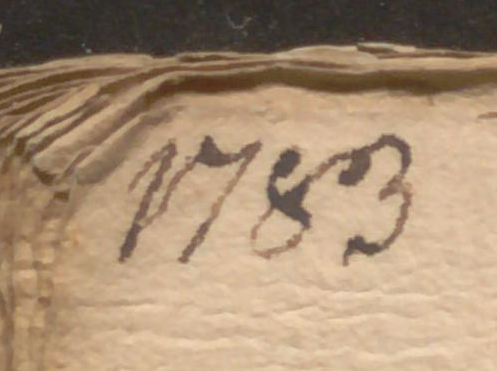1783
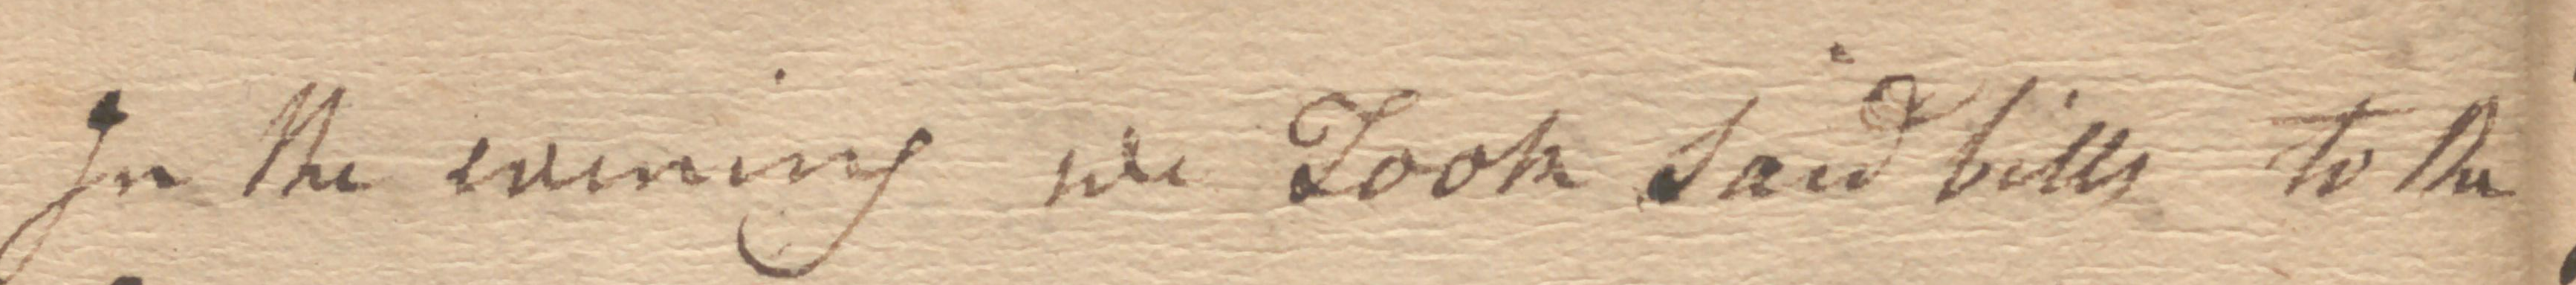In the evening we Took said bills to the
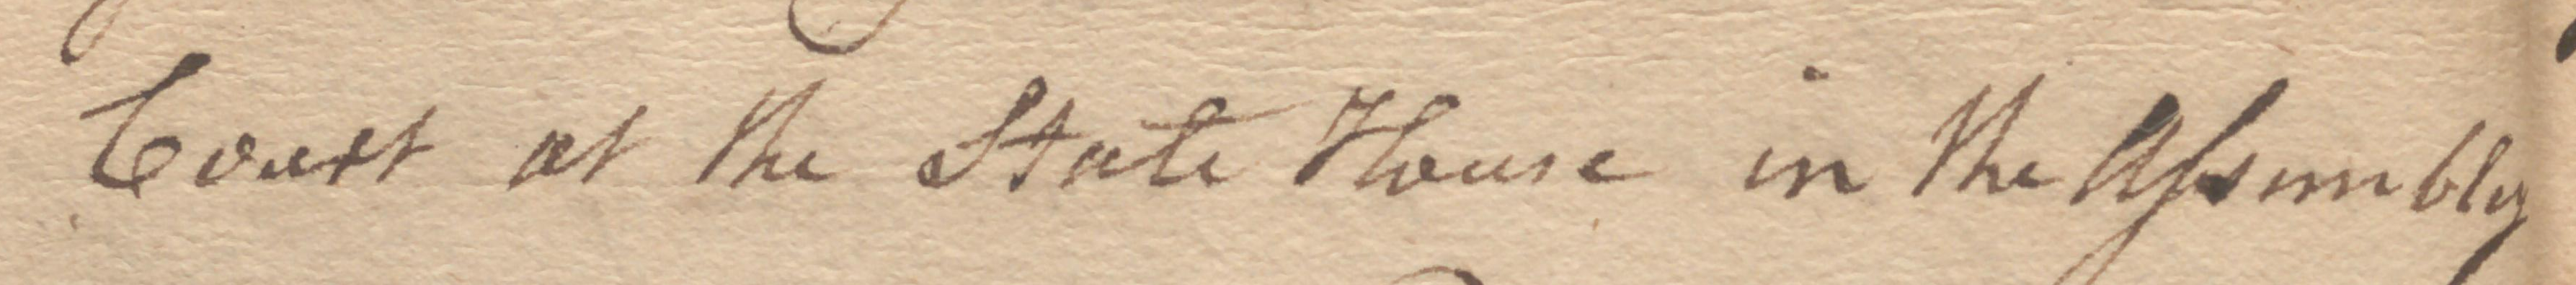Court at the State House in the Assembly
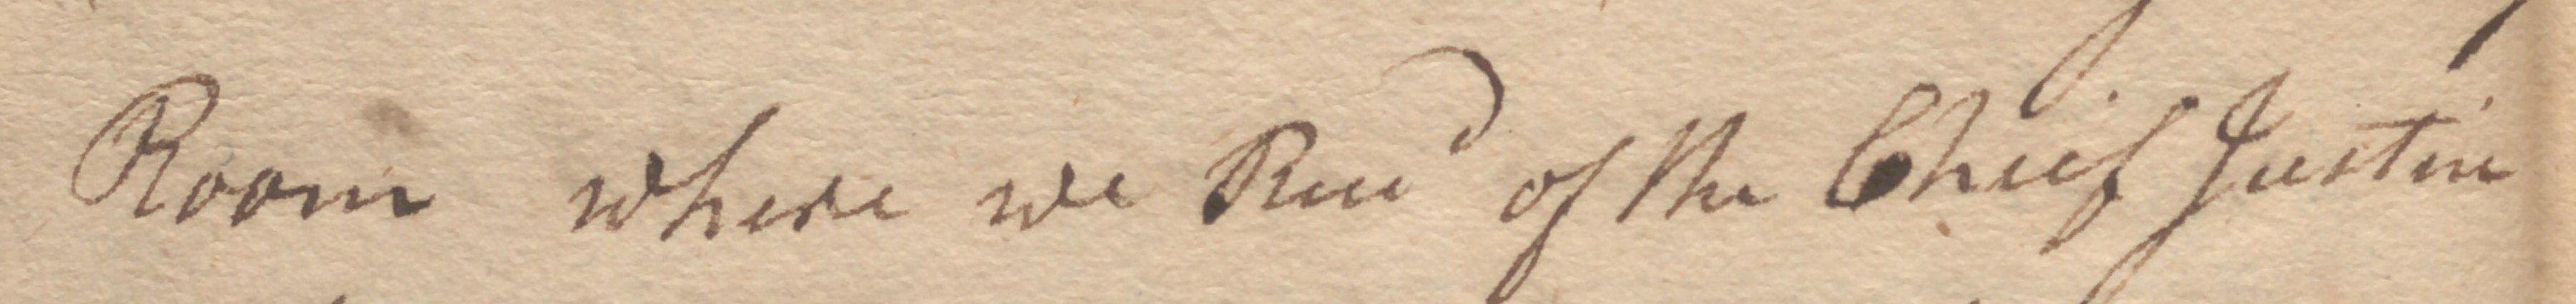Room where we Rece^d of the Chief Justice
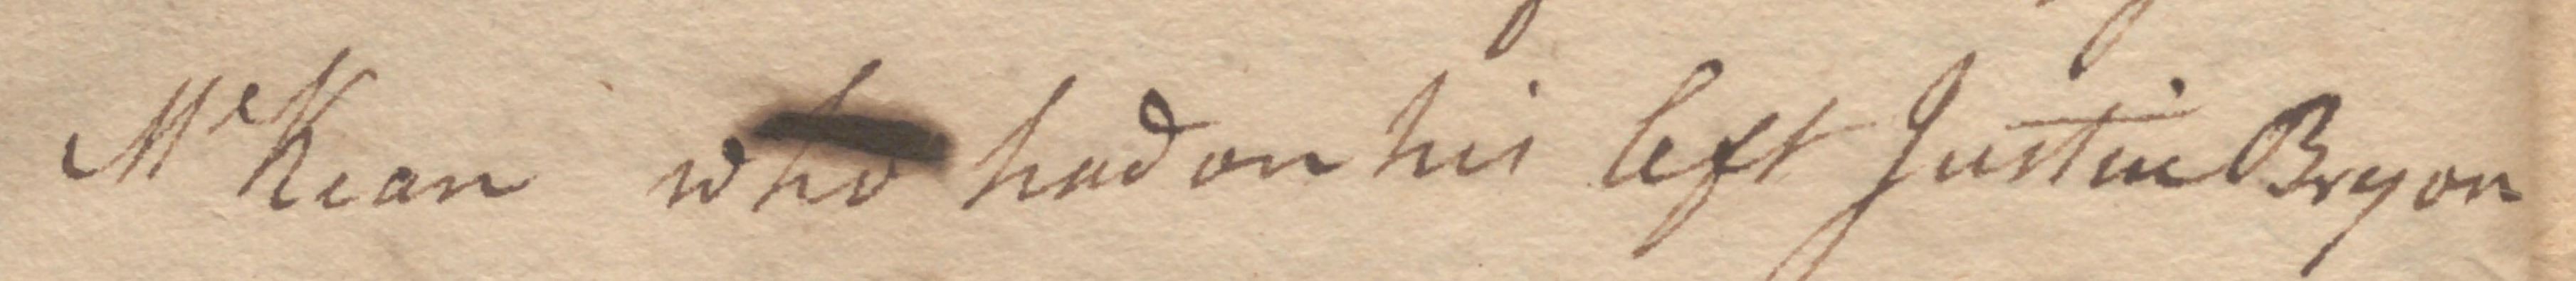M^cKean who had on his left Justice Bryon
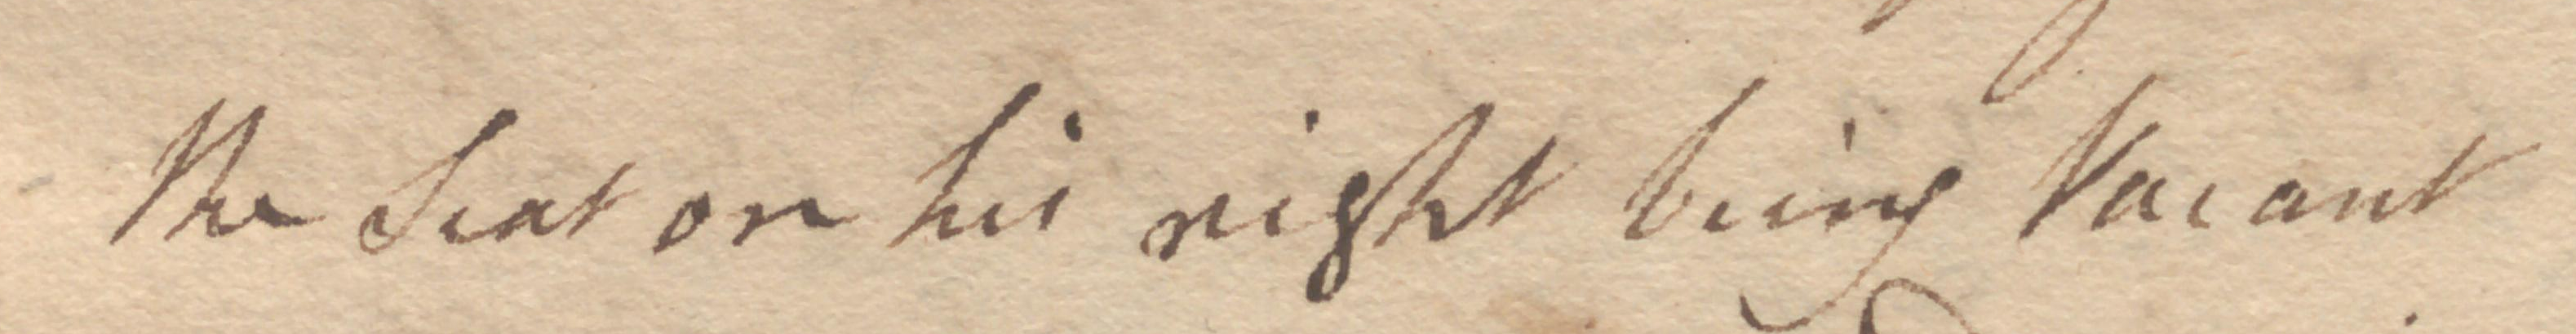the Seat on his right being Vacant
